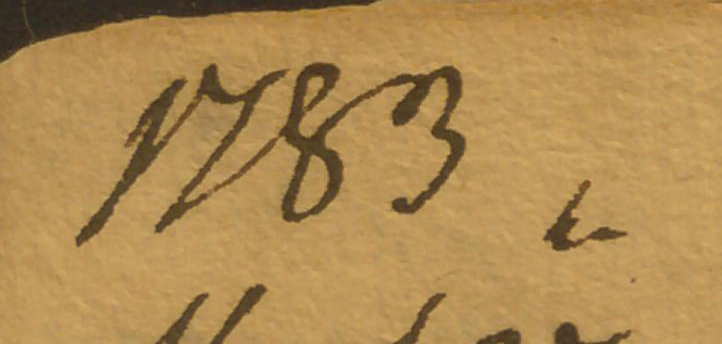1783
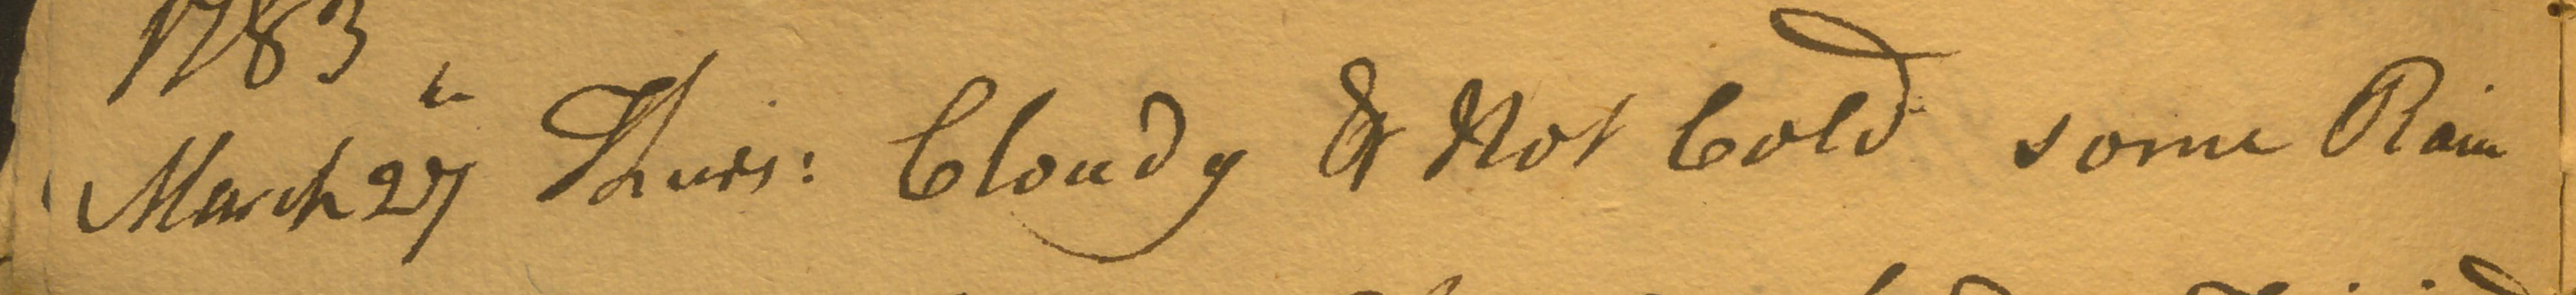March 27^th Thurs. Cloudy & Not Cold some Rain
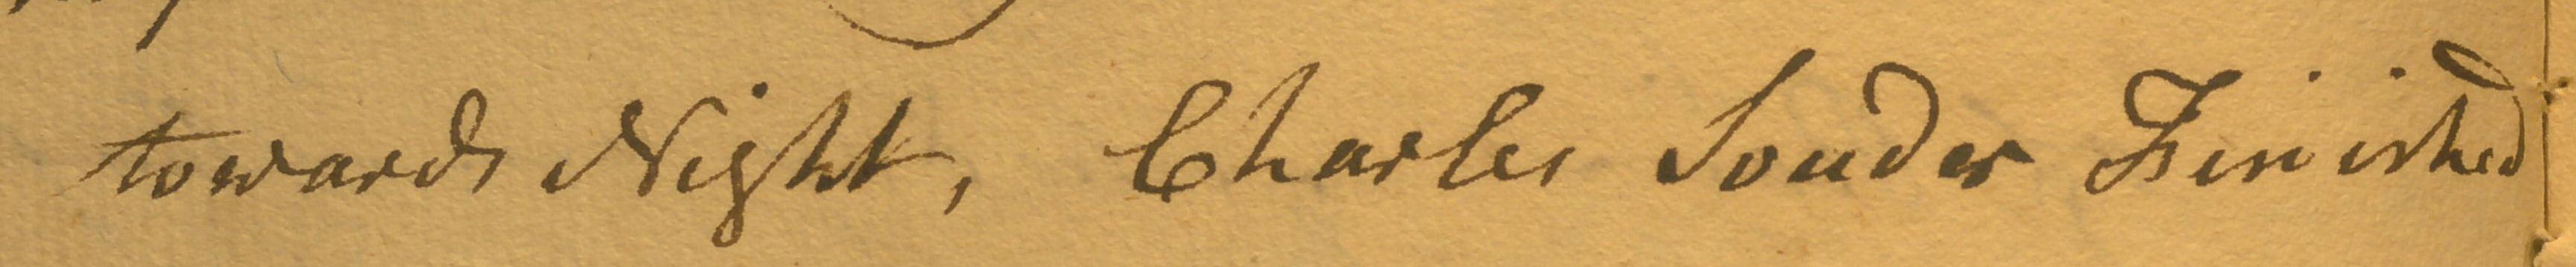towards Night, Charles Souder Finished
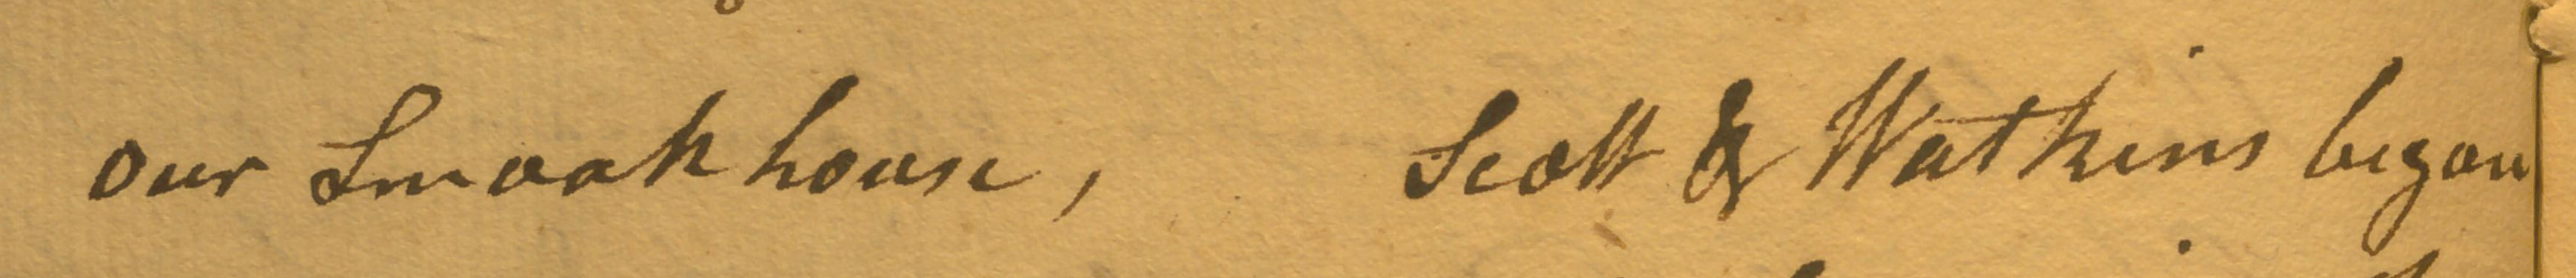our smoakhouse, Scott & Watkins began
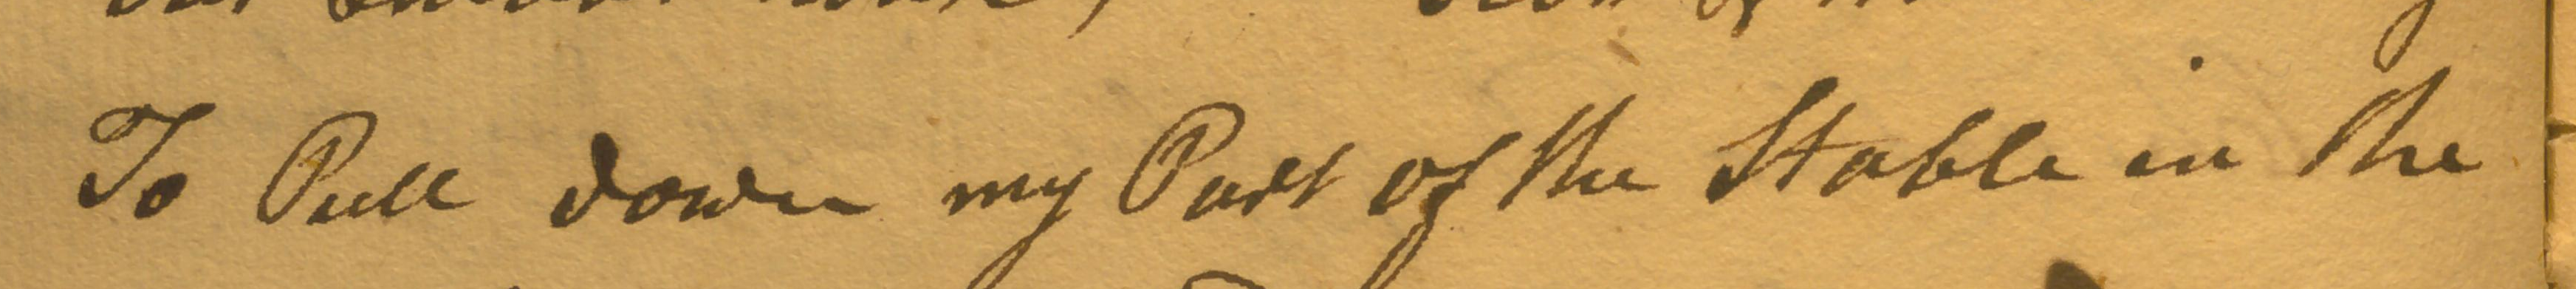To Pull down my Part of the Stable in the
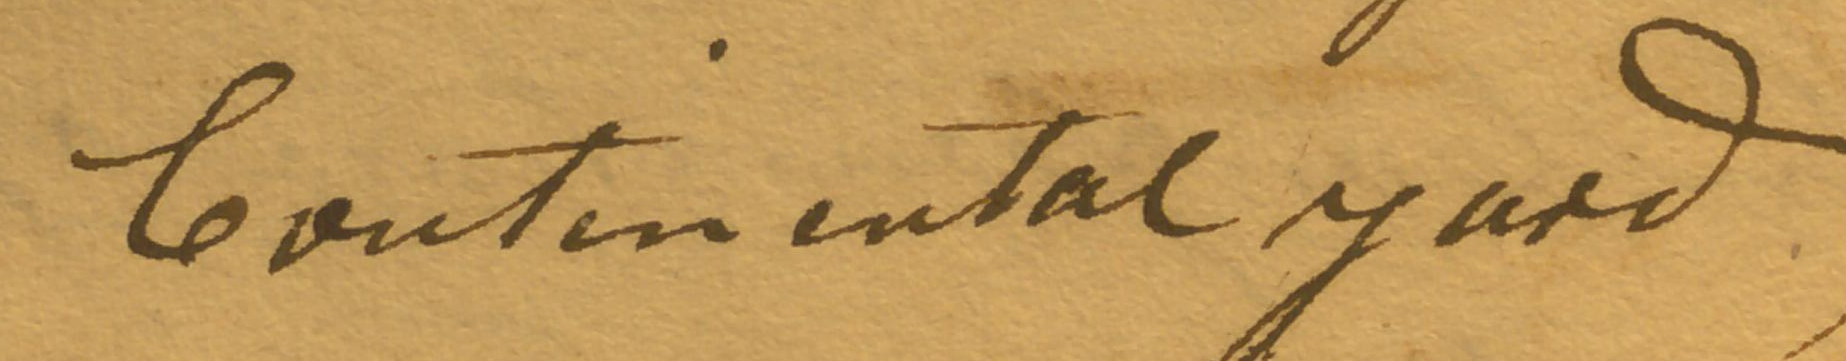Continental yard
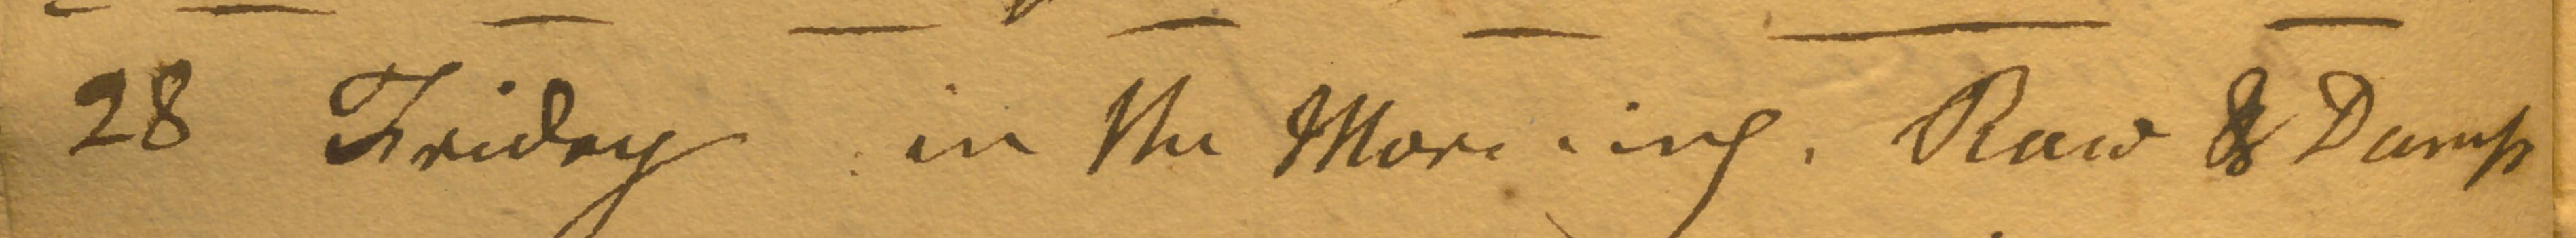28 Friday in the Morning. Raw & Damp
